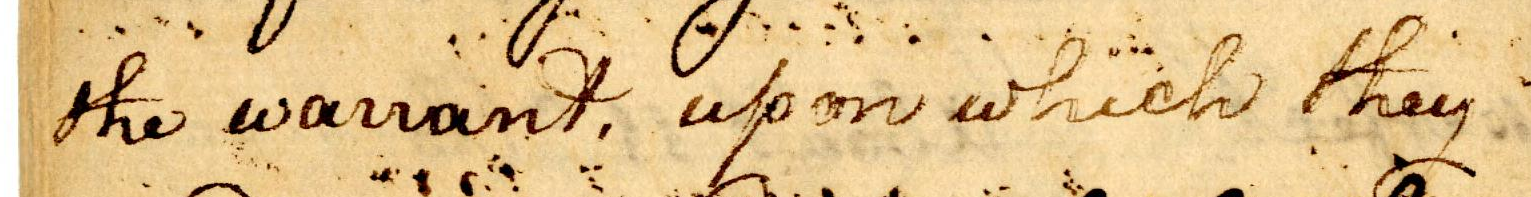the warrant, upon which they
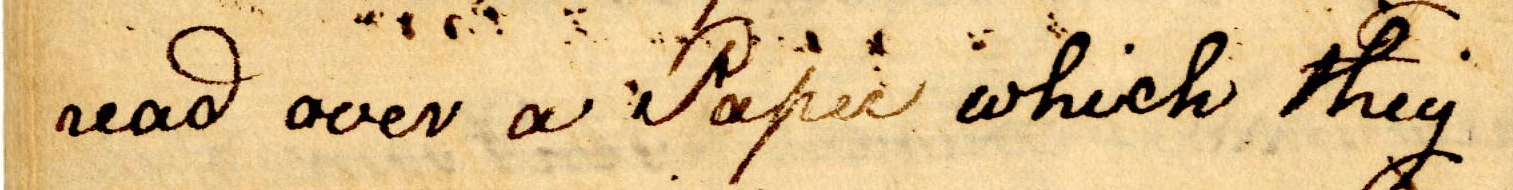read over a Paper which they
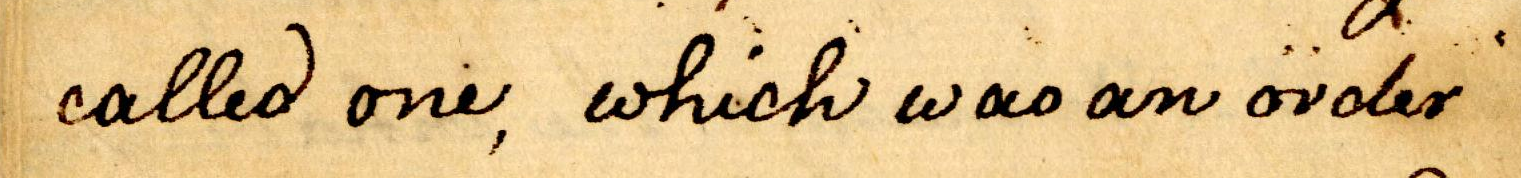called one, which was an order
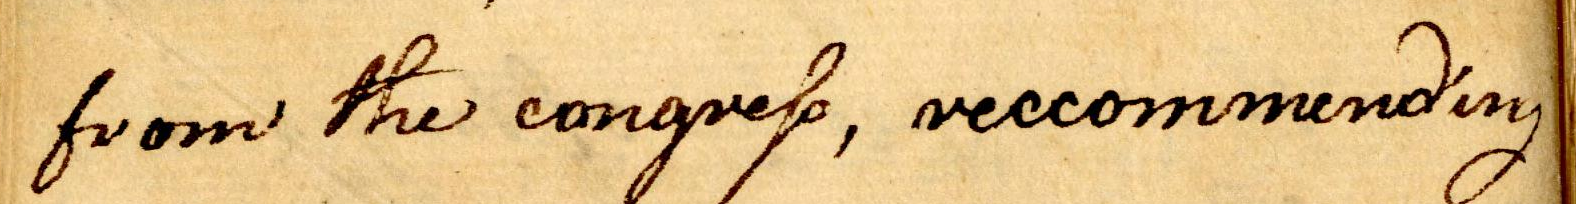from the congress, reccommending
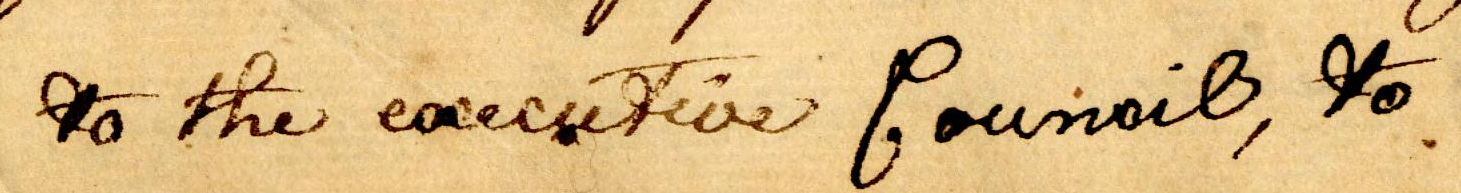to the executive Council, to
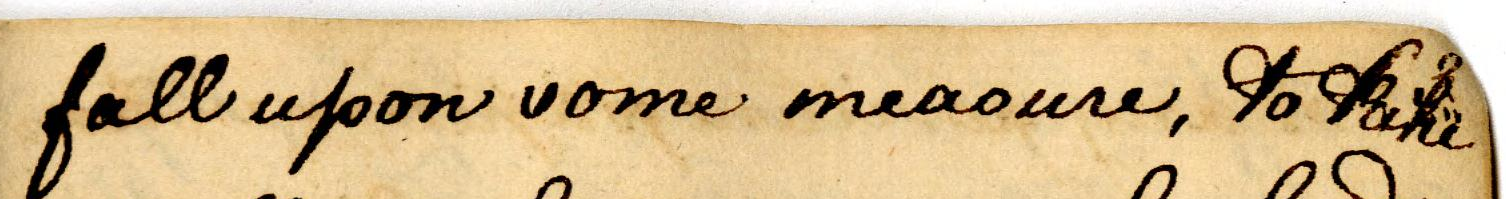fall upon some measure, to take
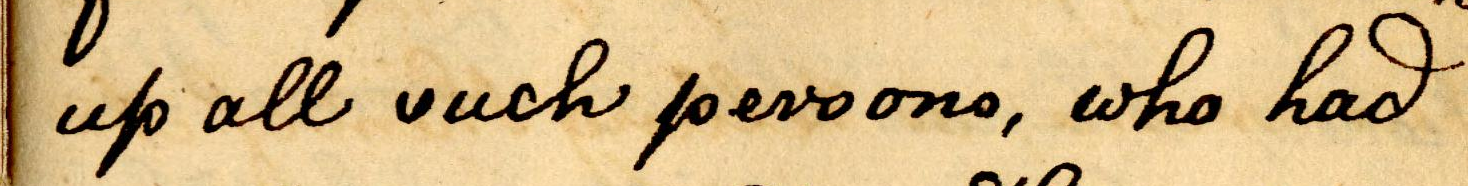up all such persons, who had
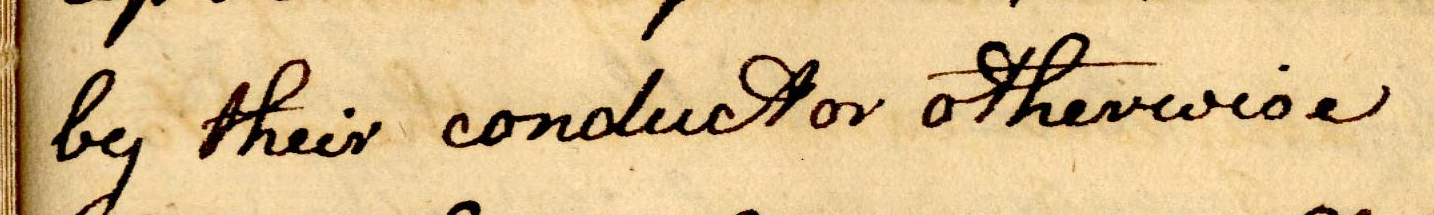by their conductor otherwise
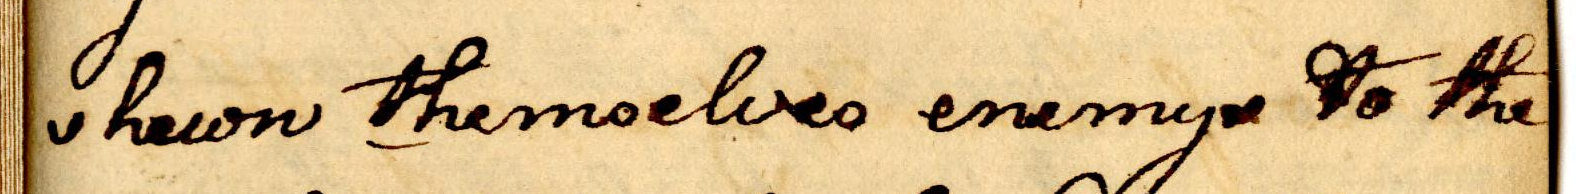shown themselves enemys to the
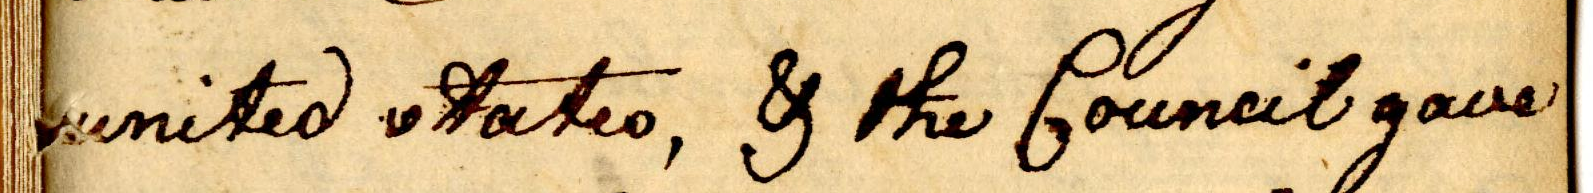united states, & the Council gave
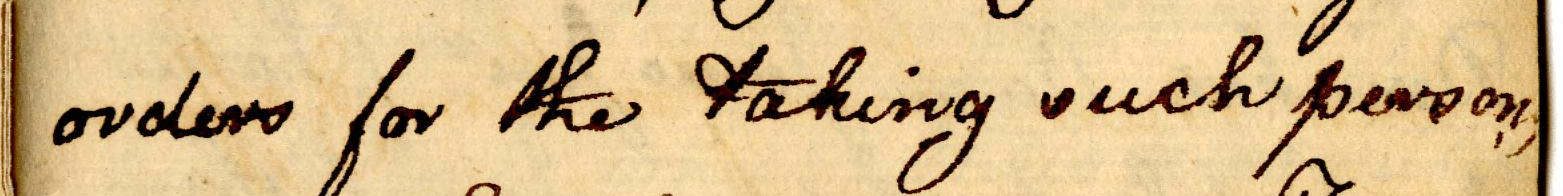orders for the taking such person
